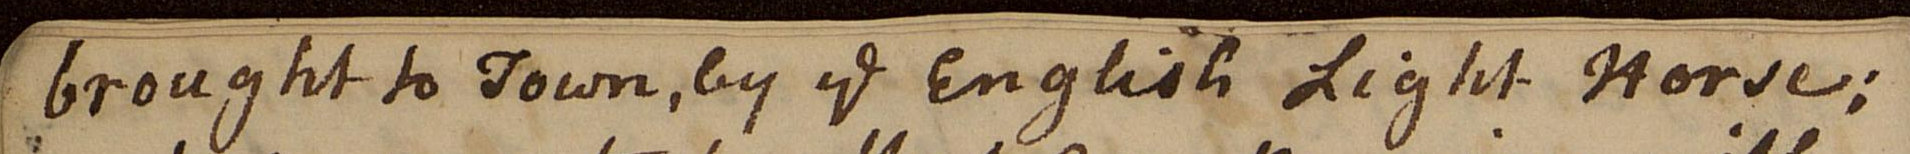brought to Town, by y^e English Light Horse:
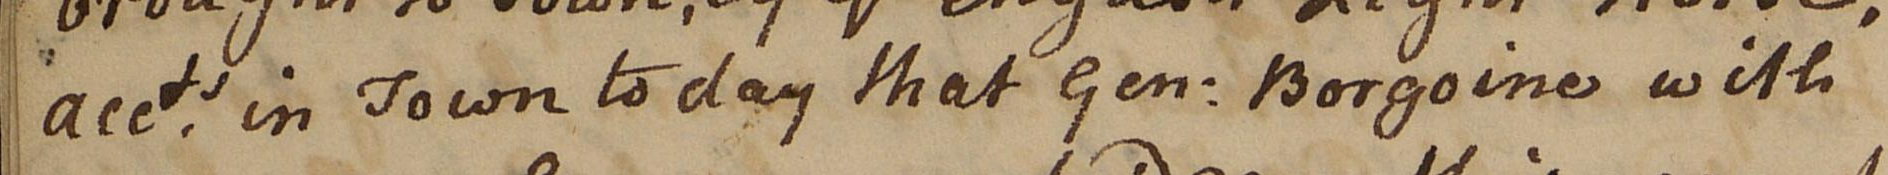acc^ts. in Town to day that Gen: Borgoine with
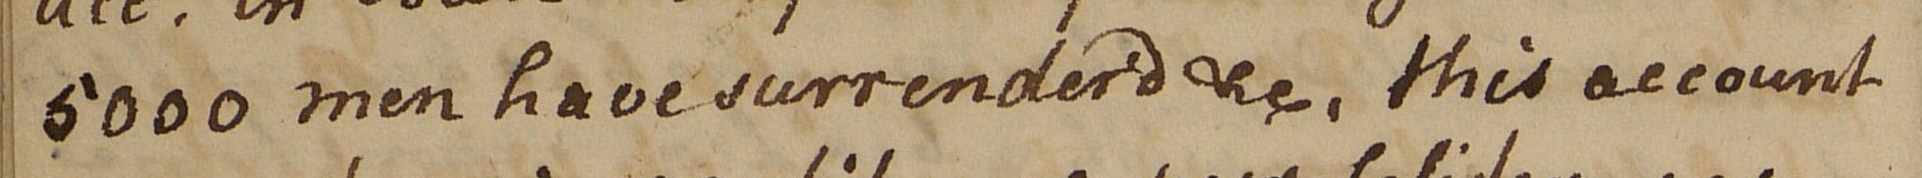5000 men have surrender'd &e, this account
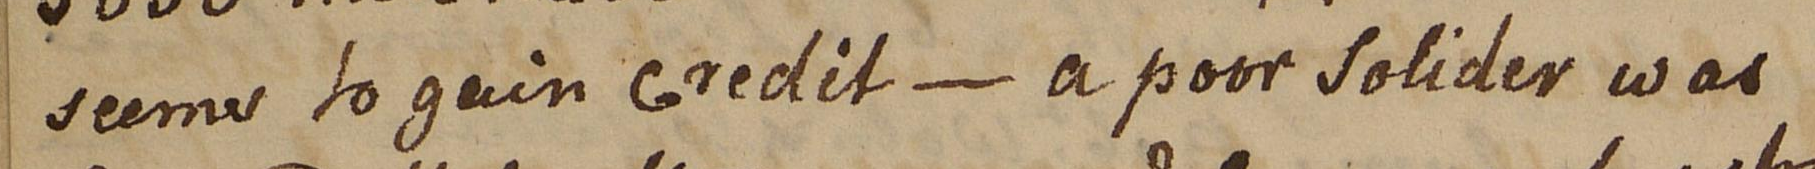seems to gain credit- a poor Solider was
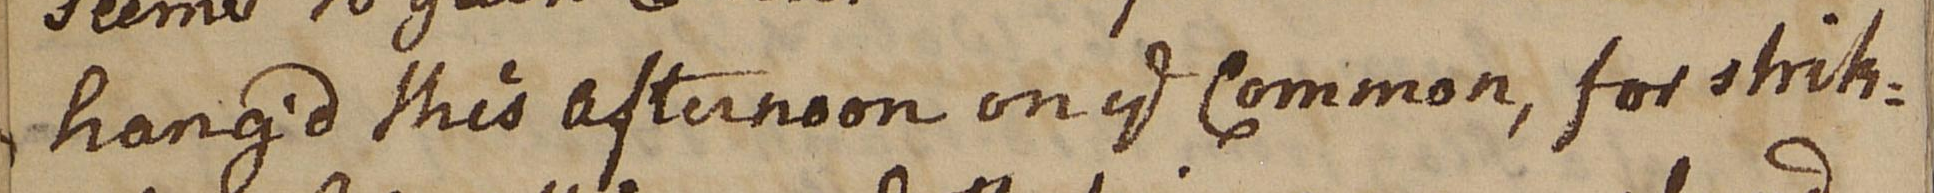hang'd this Afternoon on y^e Common, for strik-
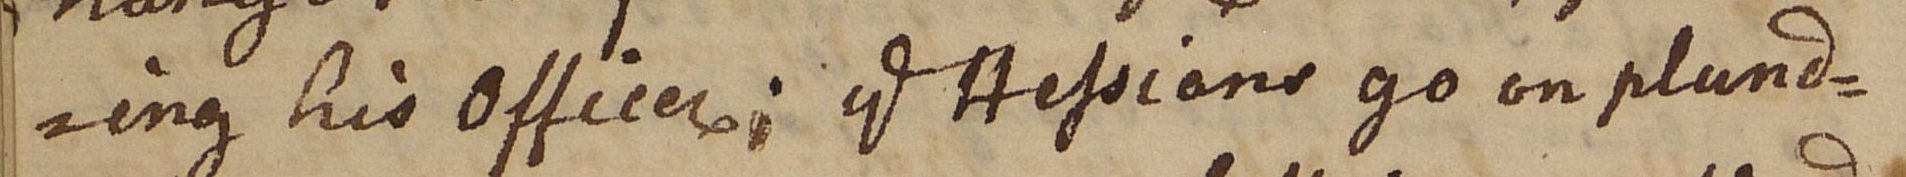-ing his Officer; y^e Hessians go on plund-
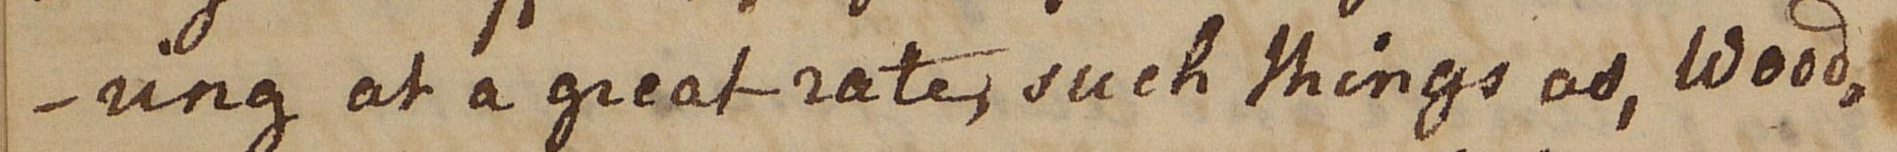-ung at a great rate, such things as, Wood,
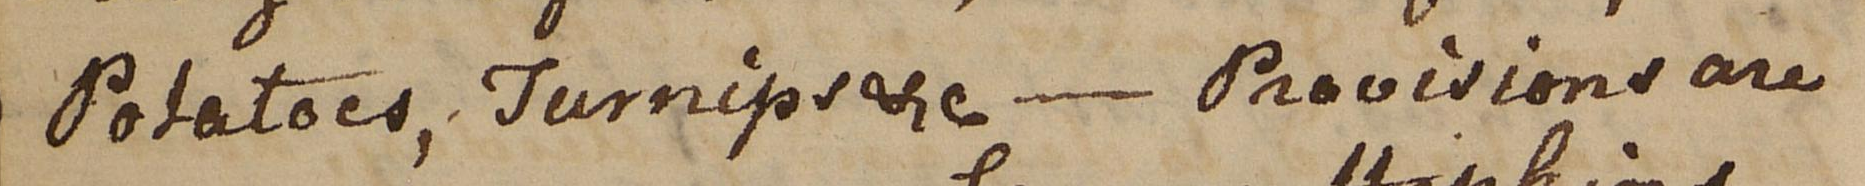Potatoes, Turnips &c - Provisions are
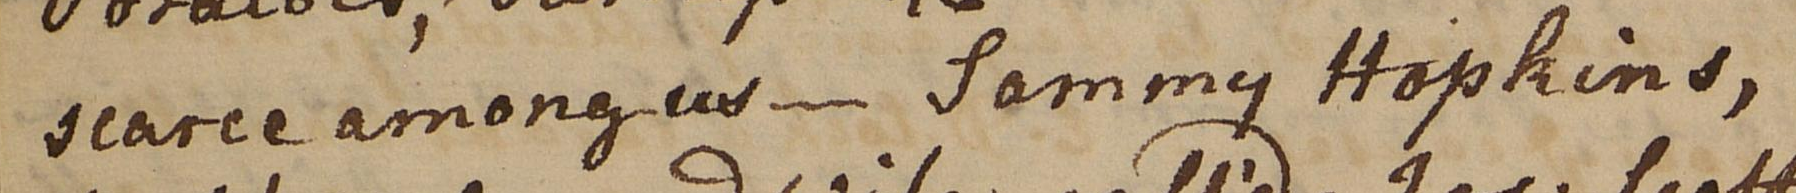scarce among us- Sammy Hopkins,
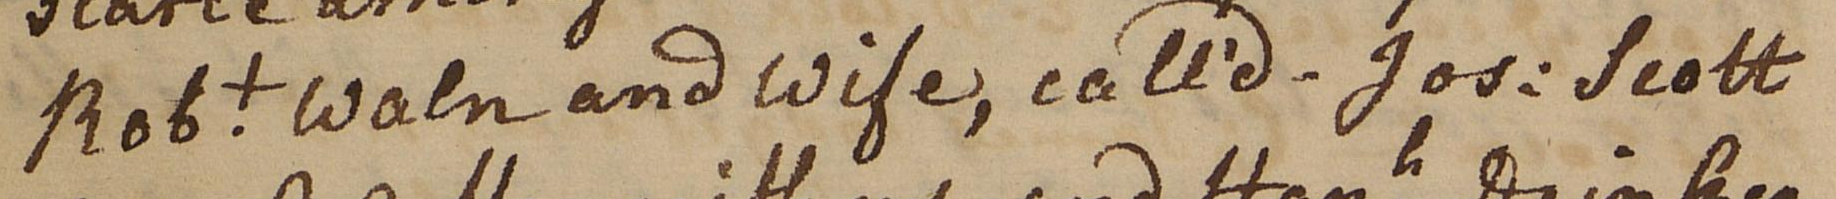Rob^t. Waln and Wife, call'd. Jos: Scott
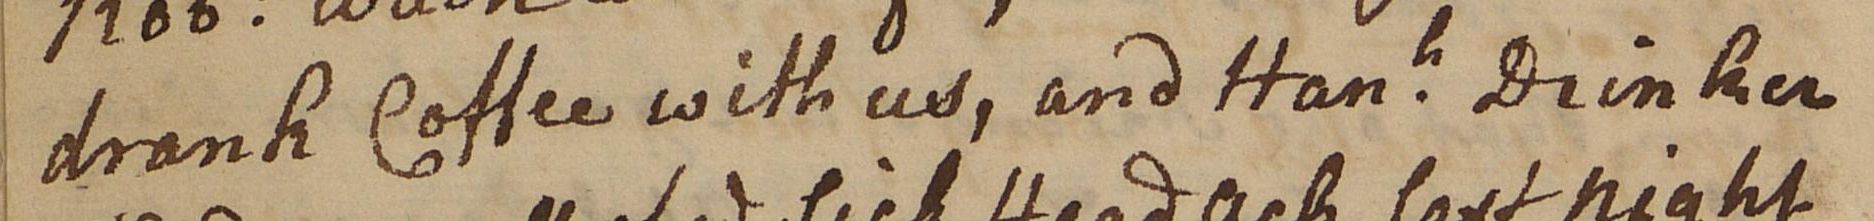drank Coffee with us, and Han^h Drinker
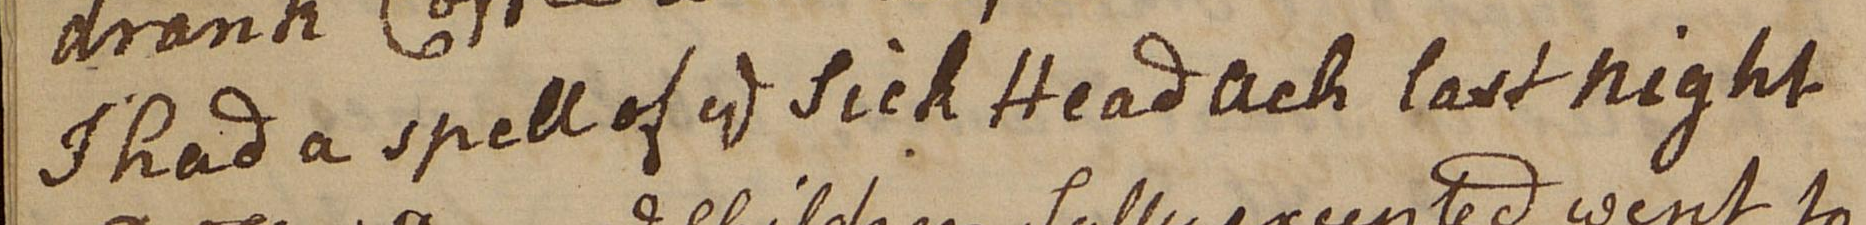I had a spell of y^e Sick Head Ach last night
